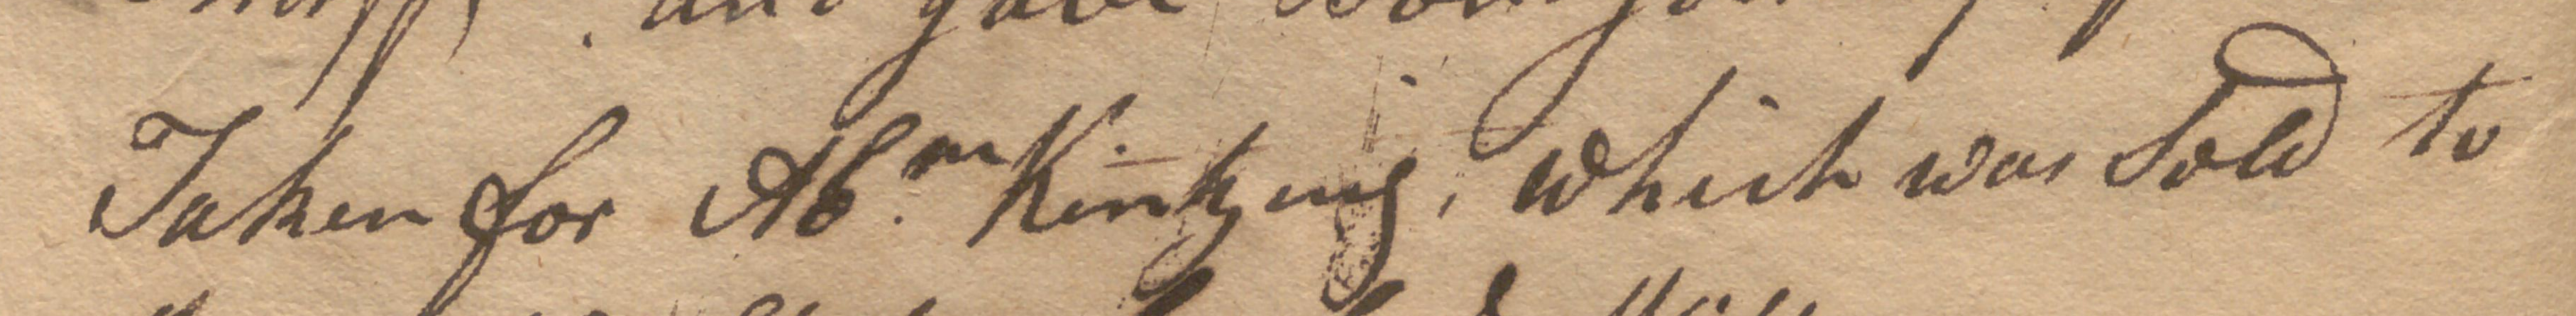Taken for Ab^m. Kinting. which was sold to
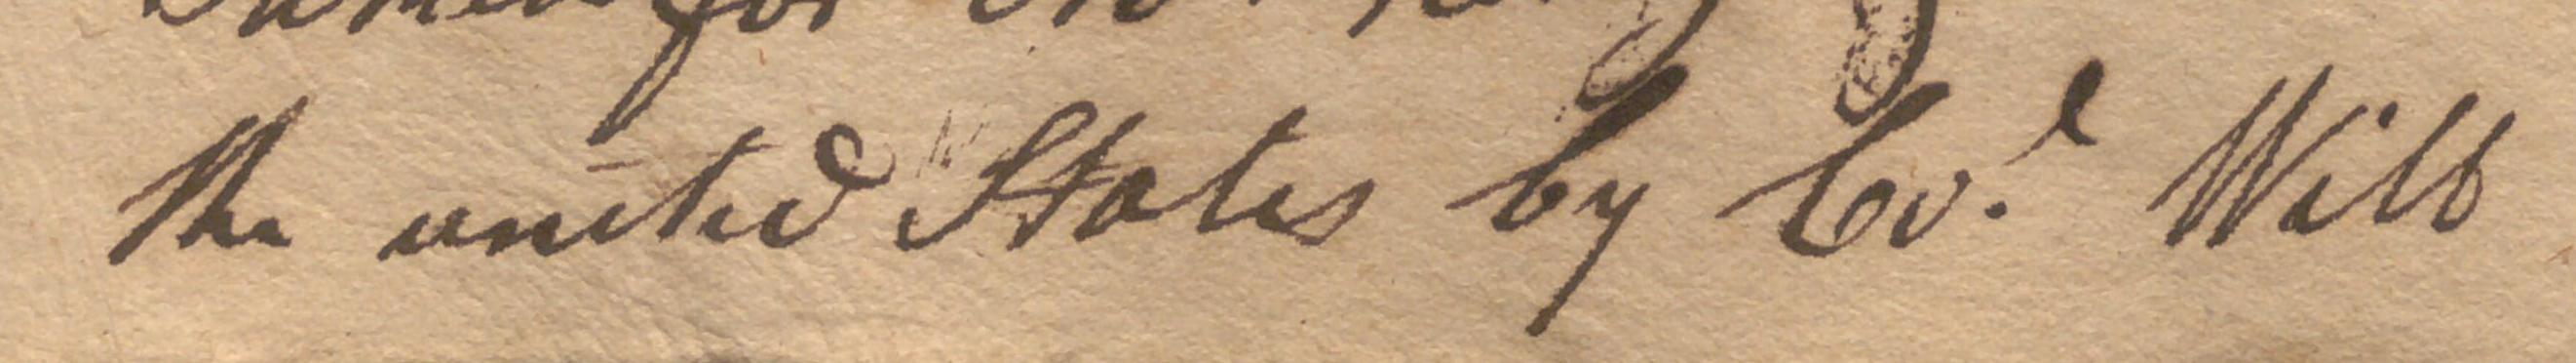the united State by Co^l. Will
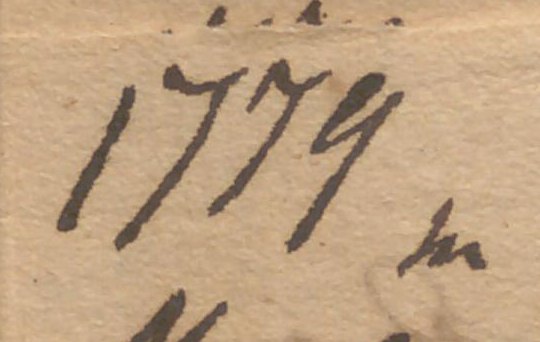1779
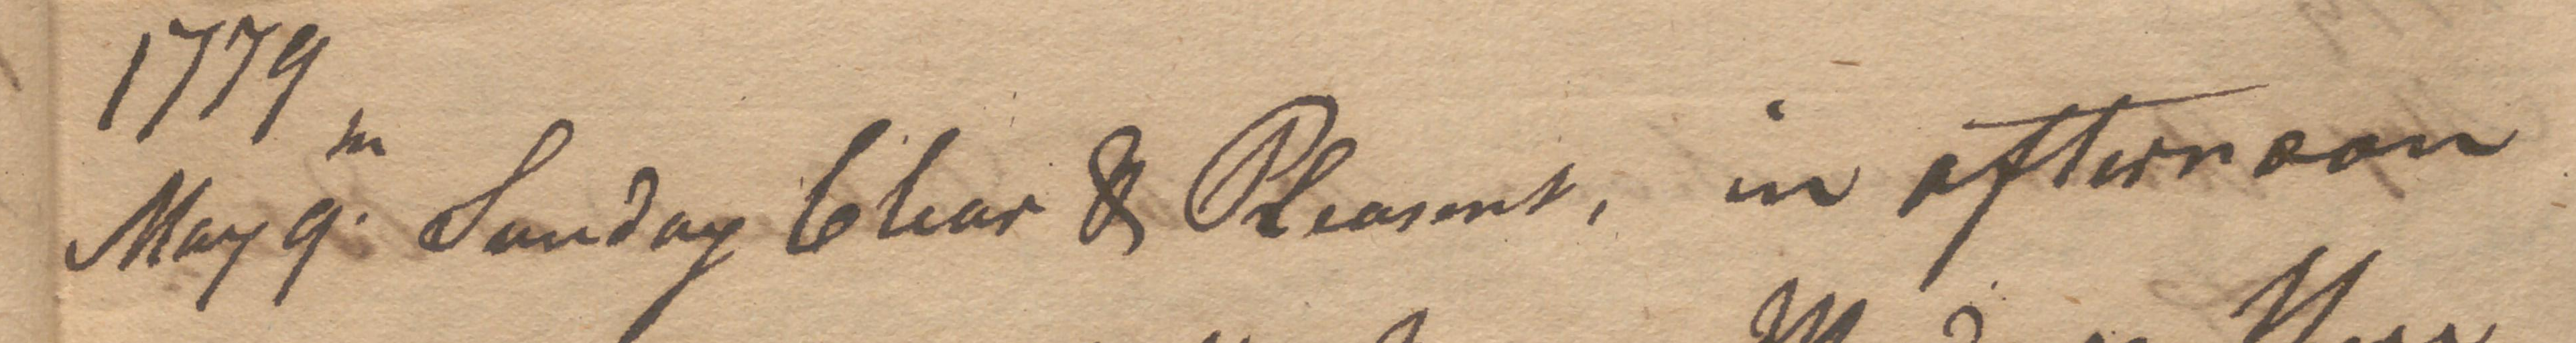May 9^th. Sunday Clear & Pleasent, in afternoon
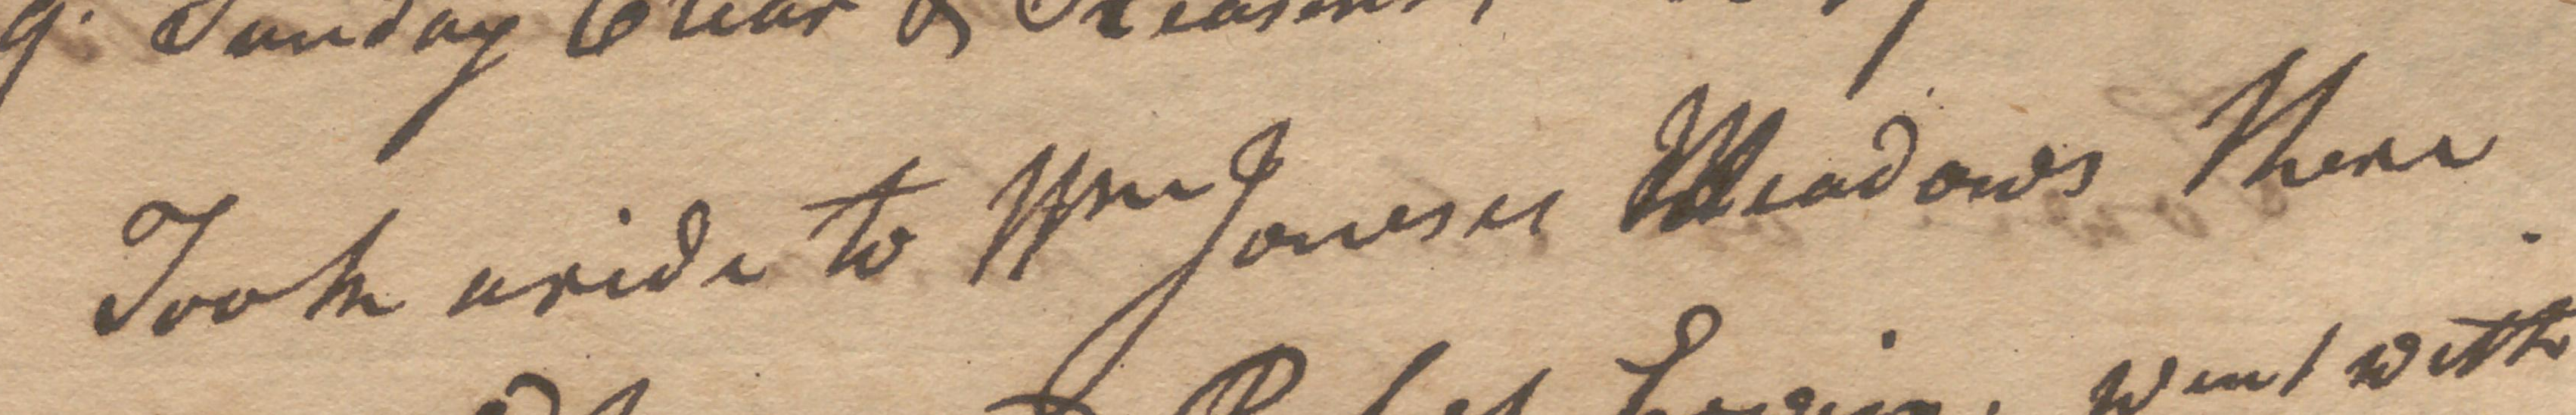Took a ride to W^m Joneses Meadows there
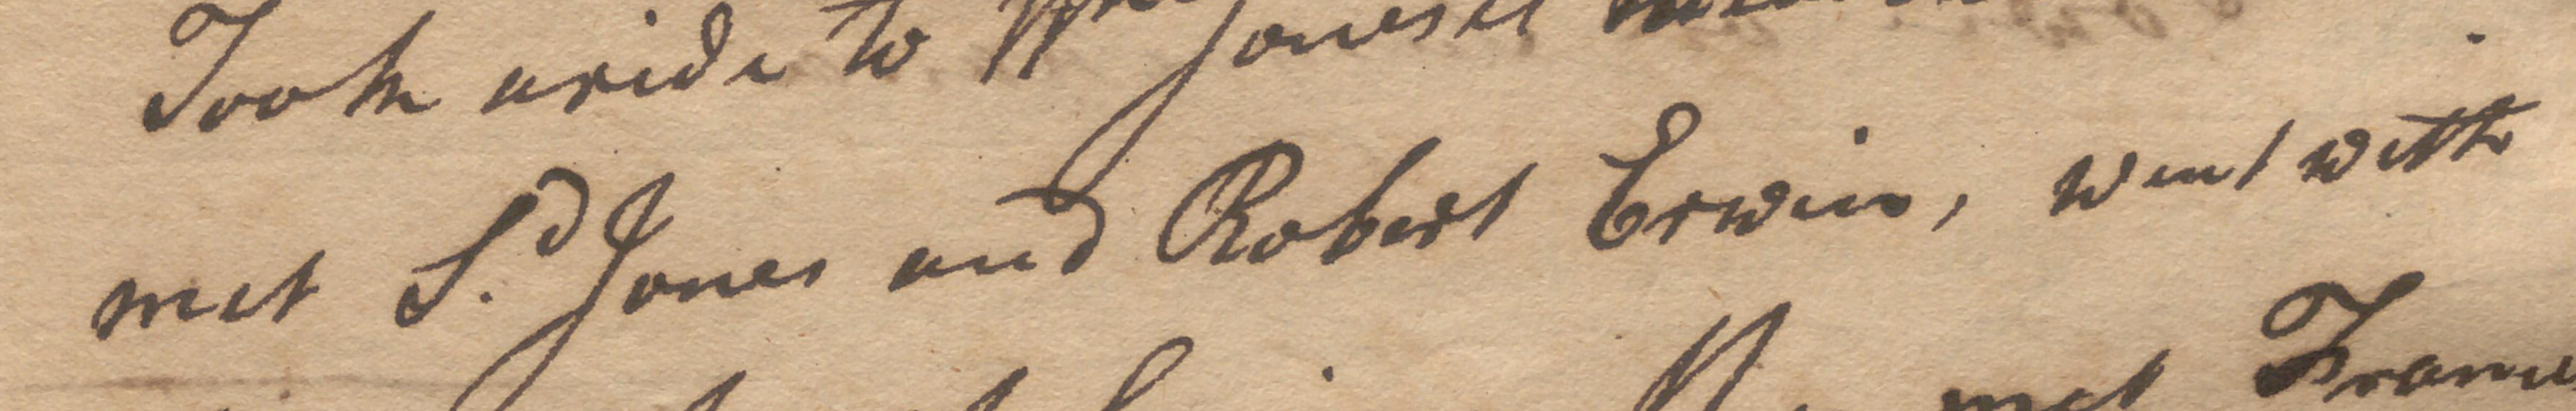mit s^d. Jones and Robert Erwin, went with
